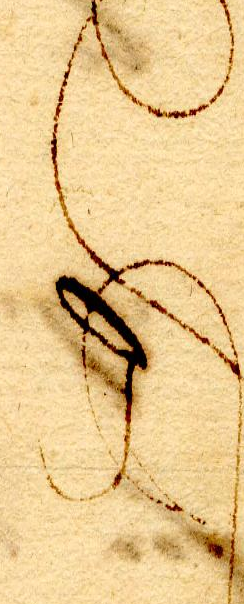To
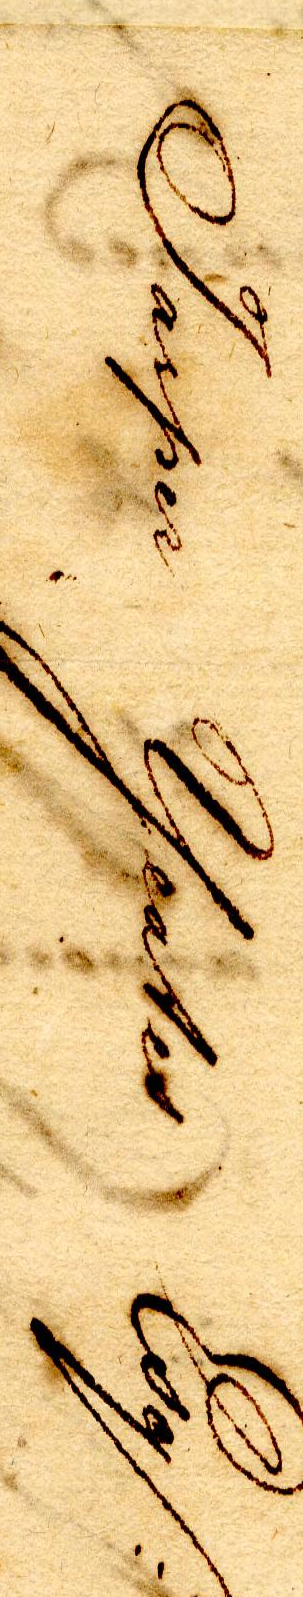Jasper Yeates Esq^r
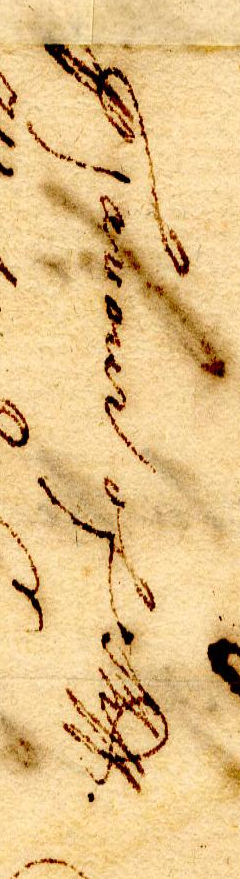Per Favour of Shiff.
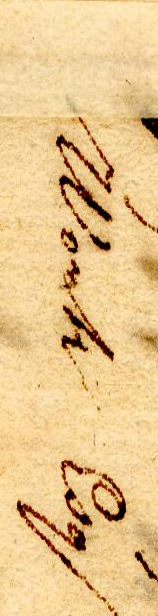Work Esq^r
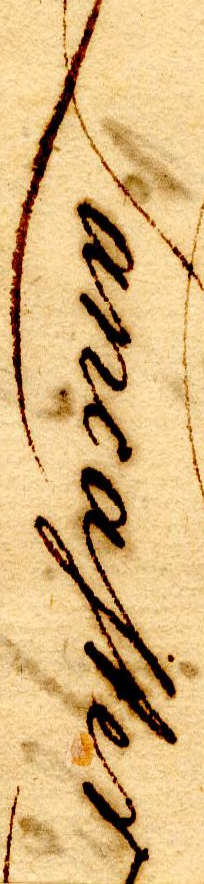Lancaster
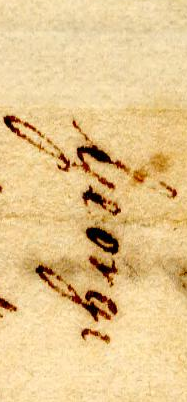George
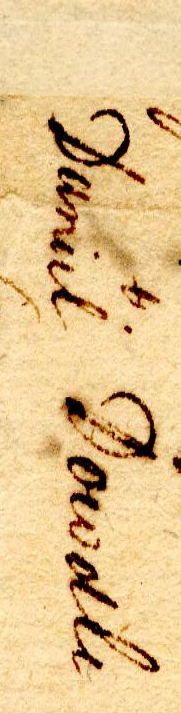Daniel Dowdle
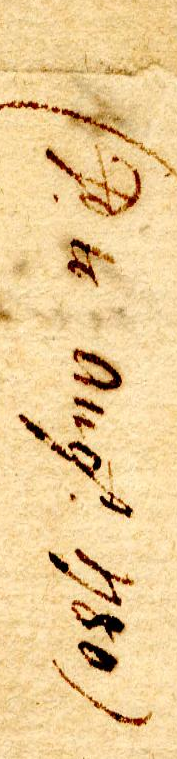(D^o. to Aug^t. 1780)
